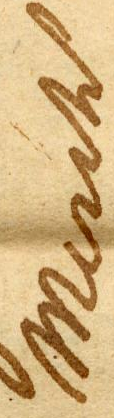Merch^t
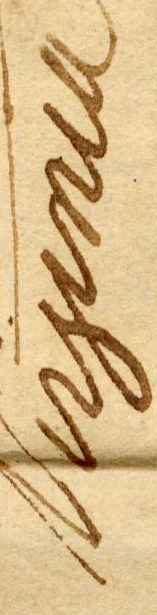Virginia
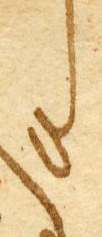To
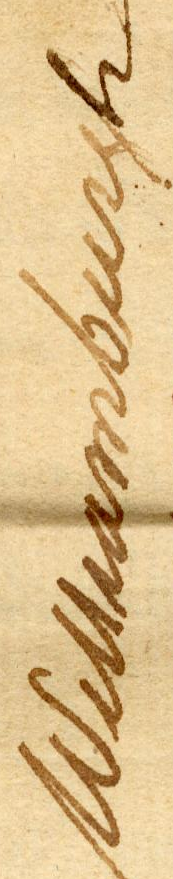Williamsburgh
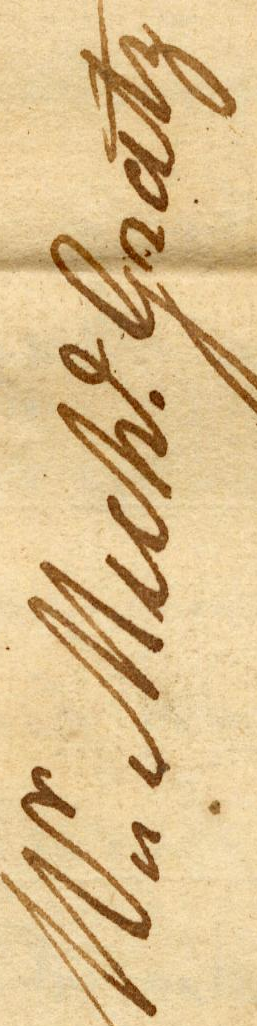M^r Mich^l Gratz
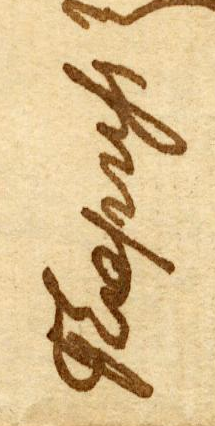per Express
